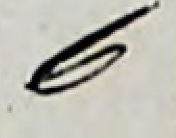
6
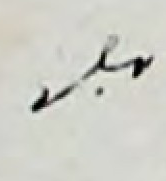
do
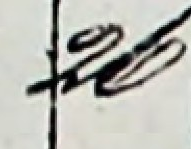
26
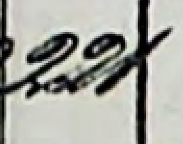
221
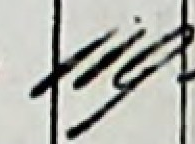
119
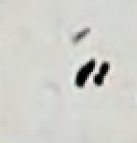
„
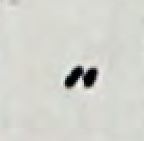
„
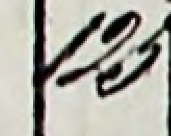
125
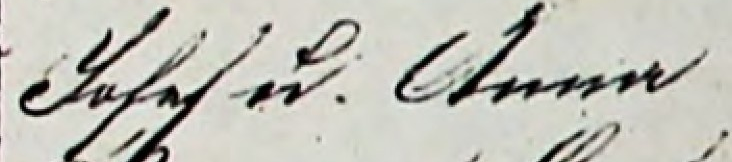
Josef u. Anna
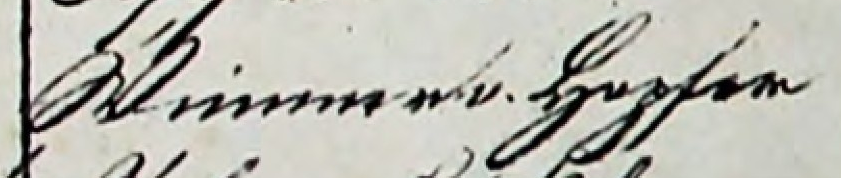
Wimmer v. Hopfer
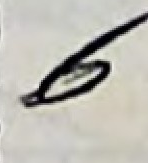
6
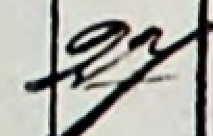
27
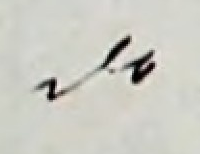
do
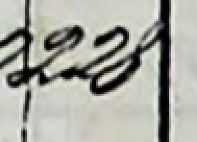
228
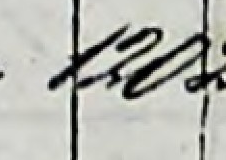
120
